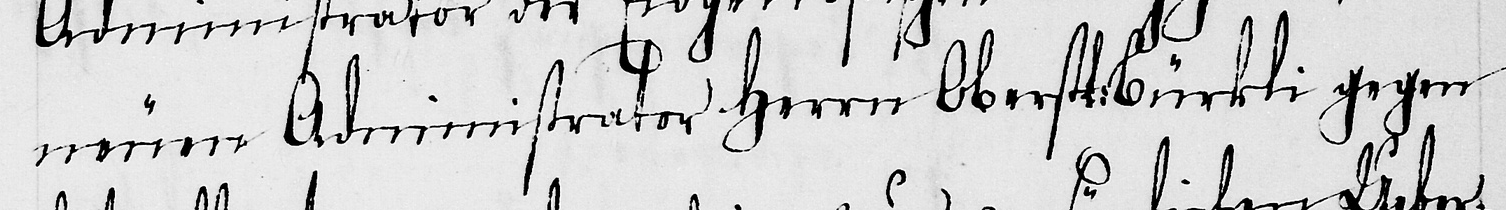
neuen Administrator Herrn Oberstl: Bürkli gegen
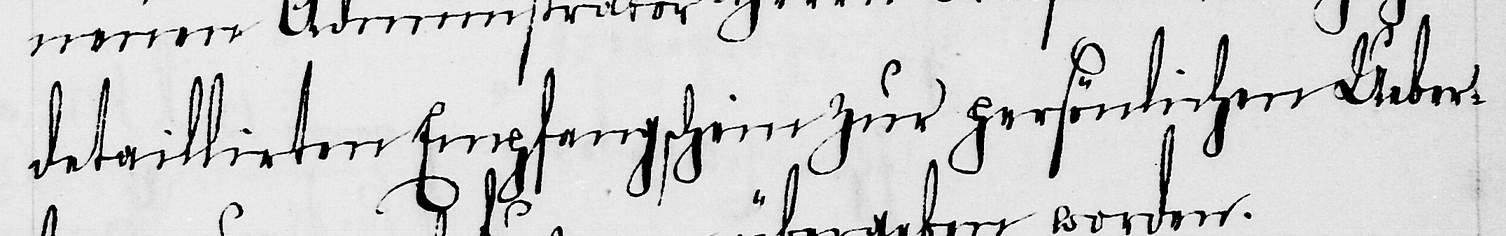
detaillierten Empfangschein zur persönlichen Ueber¬
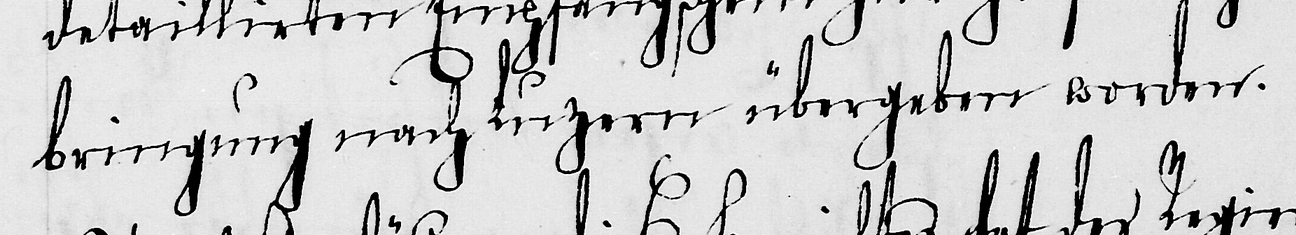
bringung nach Luzern übergeben worden.
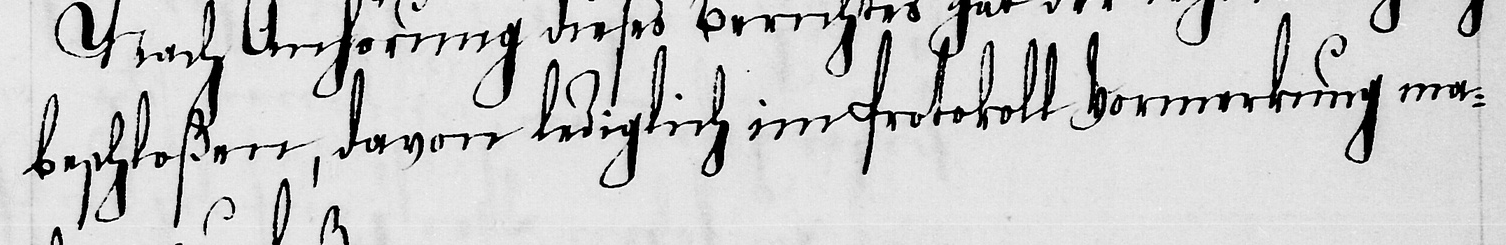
beschloßen, davon lediglich im Protokoll Vormerkung ma¬
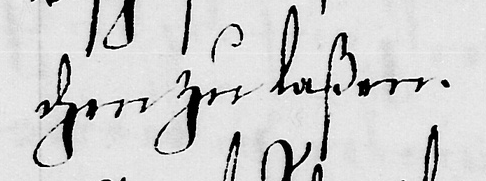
chen zu laßen.
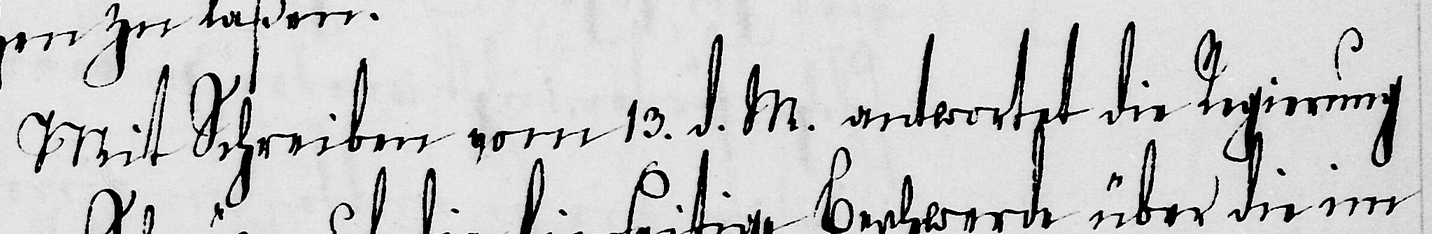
Mit Schreiben vom 13. d. M. antwortet die Regierung
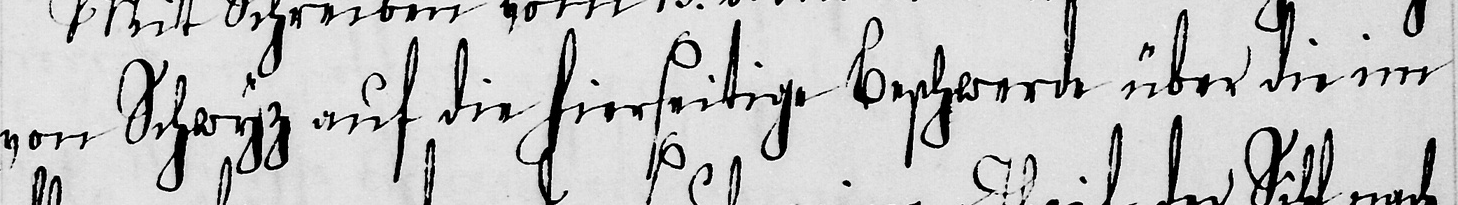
von Schwyz auf die hierseitige Beschwerde über die im
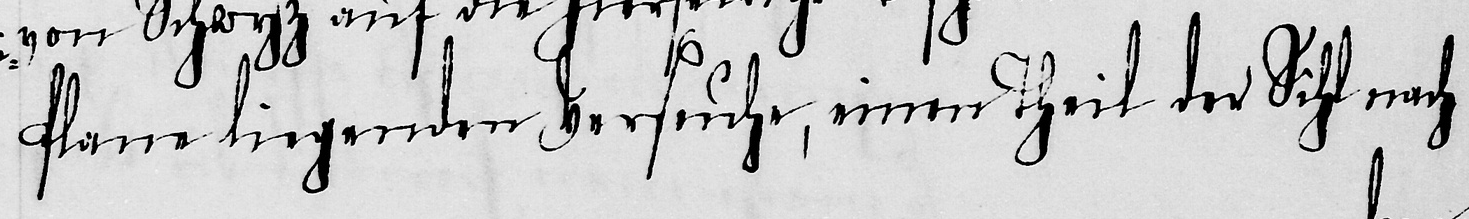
Plane liegenden Versuche, einen Theil der Sihl nach
